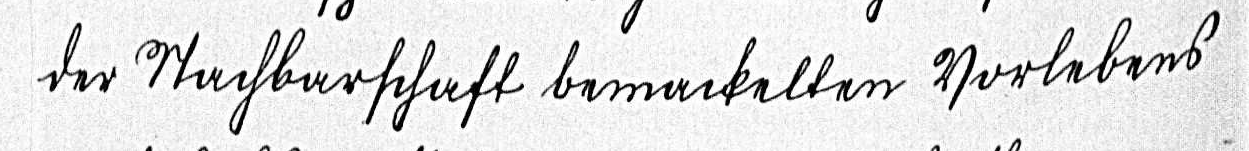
der Nachbarschaft bemackelten Vorlebens
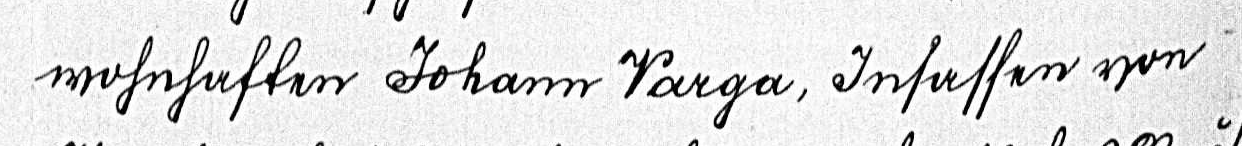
wohnhafter Johann Varga, Insassen von
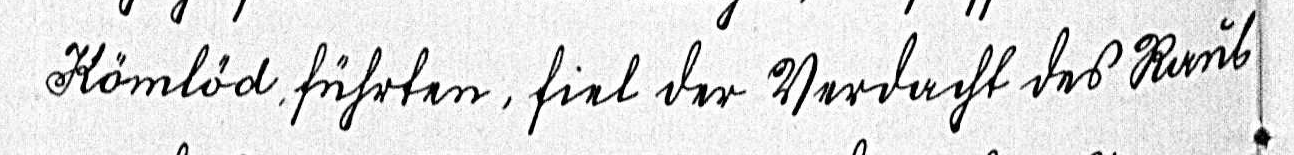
Kőmlőd führten, fiel der Verdacht des Raub¬
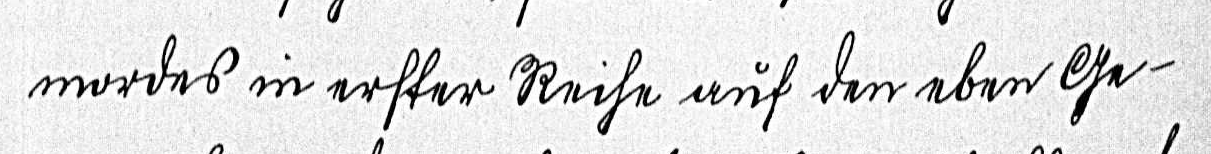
mordes in erster Reihe auf den eben ge¬
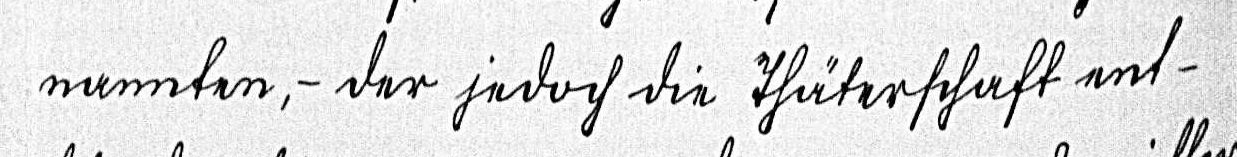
nannten, – der jedoch die Thäterschaft ent¬
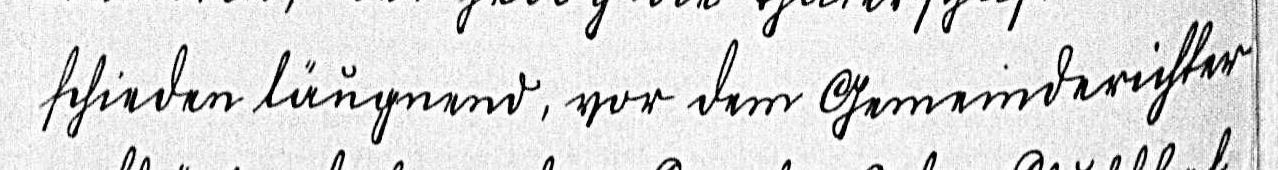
schieden läugnend, vor dem Gemeinderichter
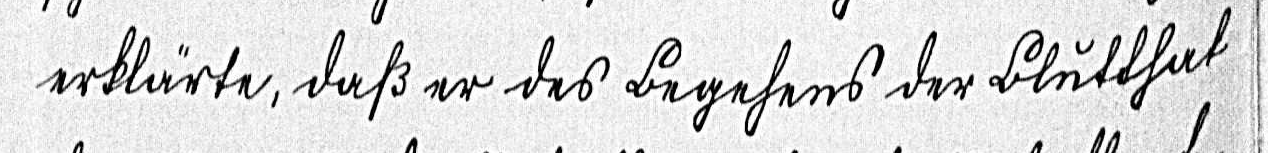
erklärte, daß er das Begehens der Blutthat
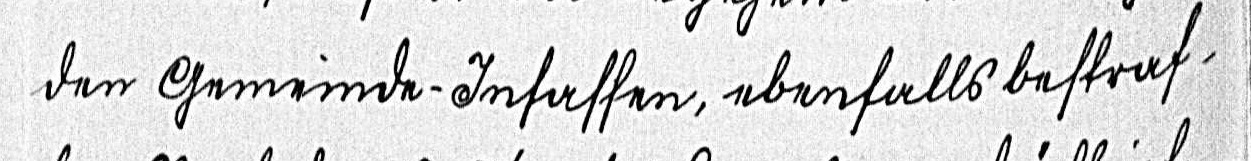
den Gemeinde-Insassen, ebenfalls bestraf¬
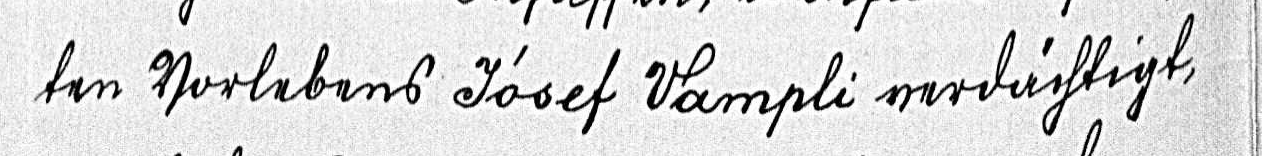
ten Vorlebens Jósef Vampli verdächtigt,
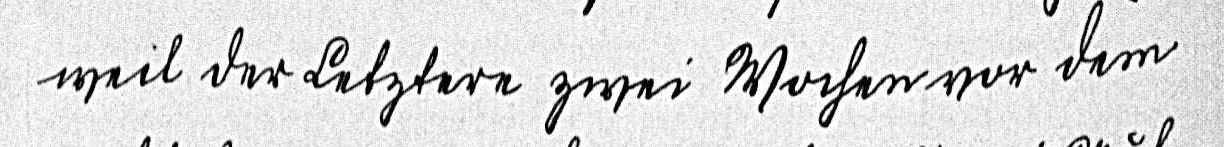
weil der Letztere zwei Wochen vor dem
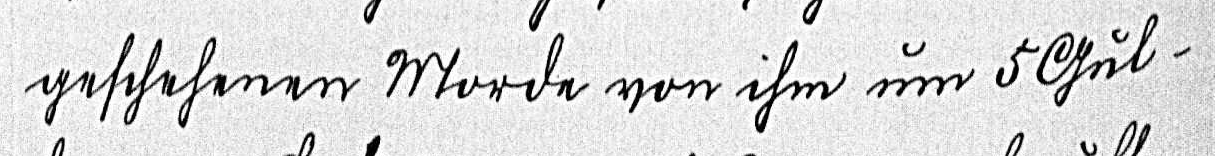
geschehenen Morde von ihm um 5 Gul¬
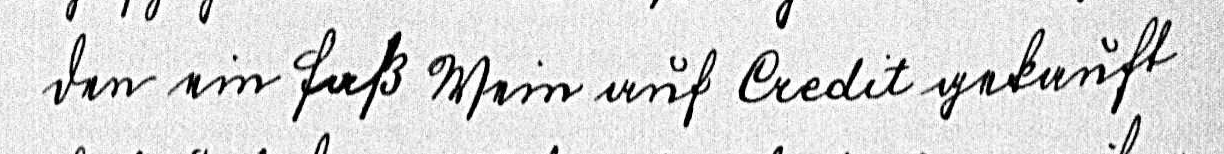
den ein Faß Wein auf Credit gekauft
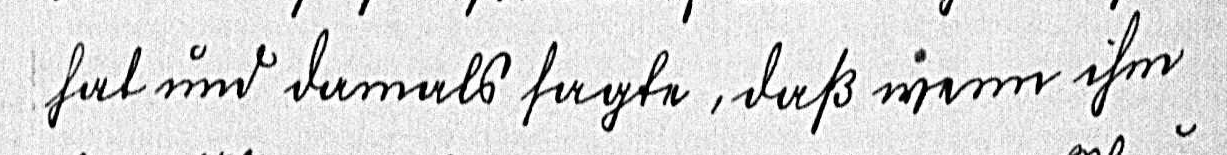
hat und damals sagte, daß wenn ihm
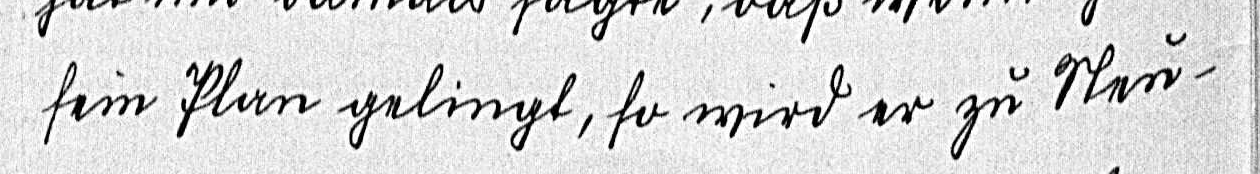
sein Plan gelingt, so wird er zu Neu¬
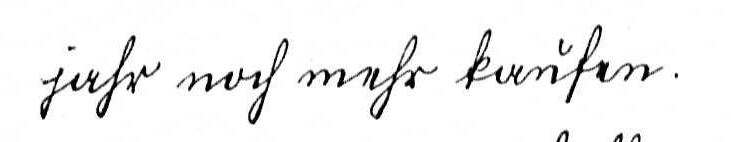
jahr noch mehr kaufen.
